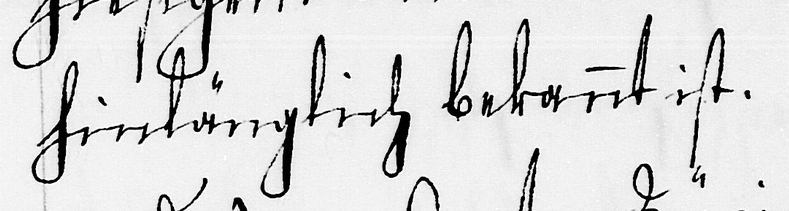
hinlänglich bekannt ist.
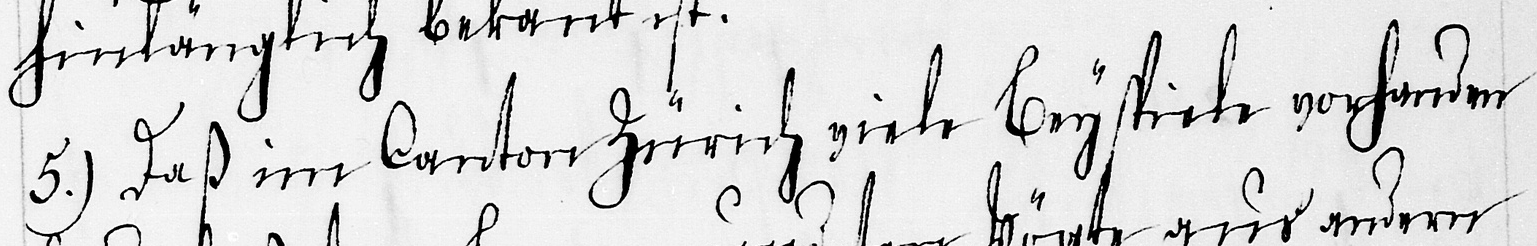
5.) Daß im Canton Zürich viele Beyspiele vorhanden
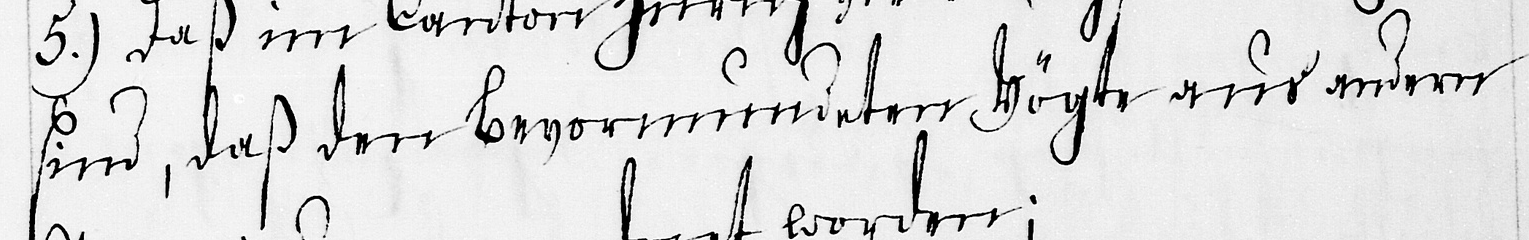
sind, daß den Bevormundeten Vögte aus andern
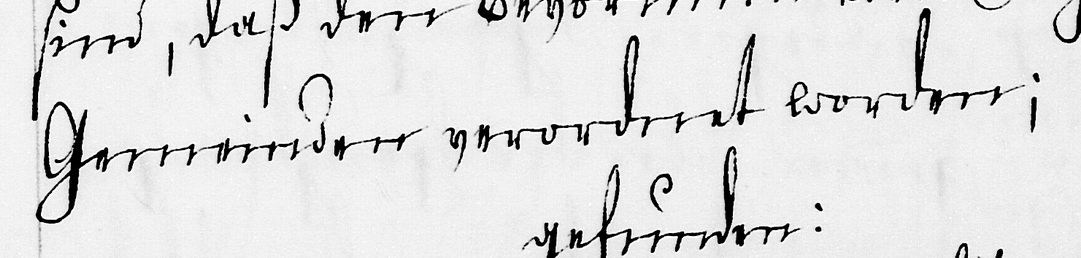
Gemeinden verordnet worden;
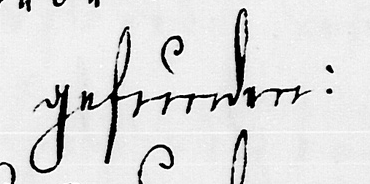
gefunden:
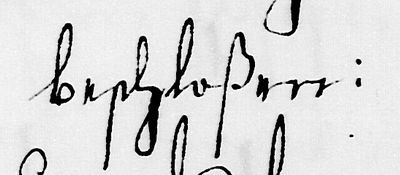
beschloßen:
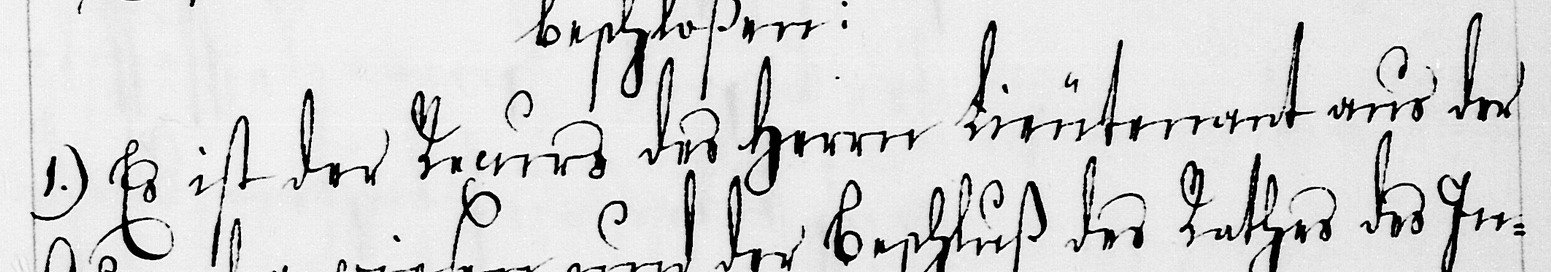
1.) Es ist der Recurs des Herrn Lieutenant aus der
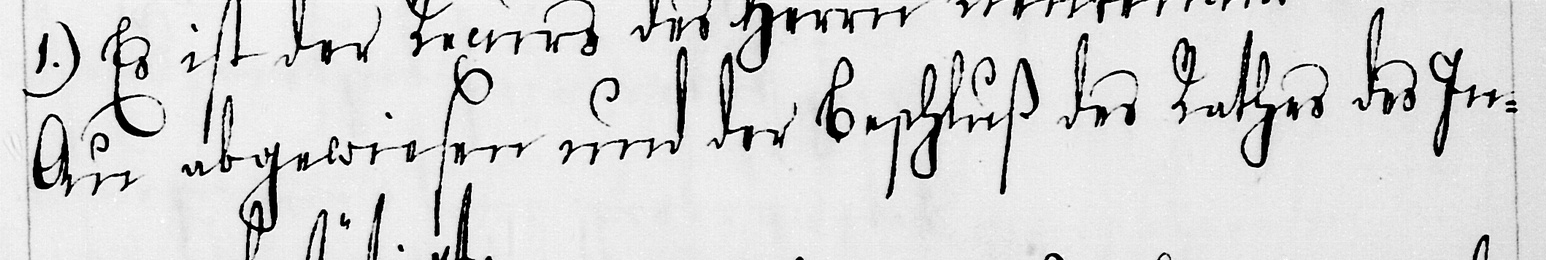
Au abgewiesen und der Beschluß des Rathes des In¬
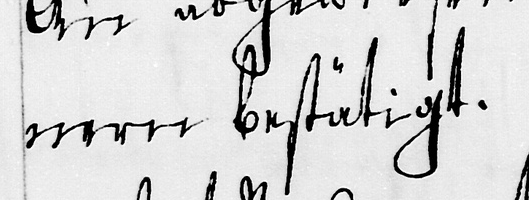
nern bestätigt.
